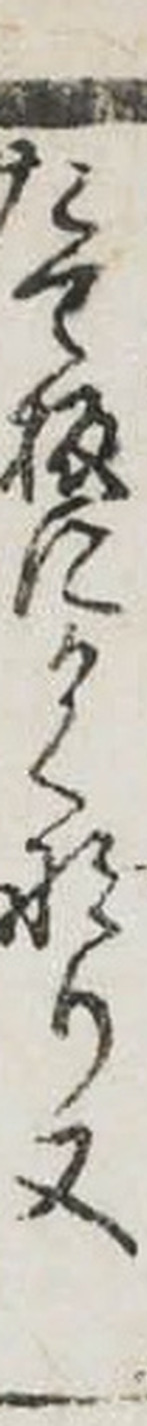たて板にかくなり又
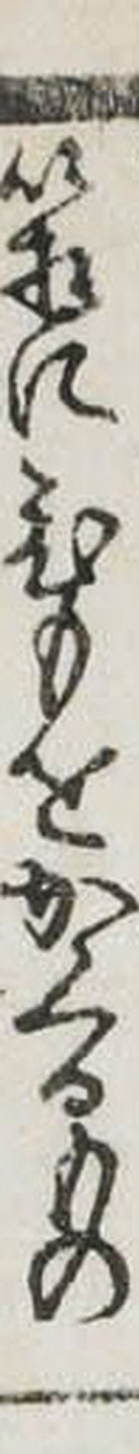箱にひもをかくるもの
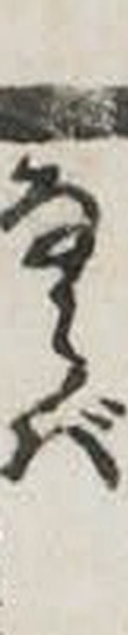ならば
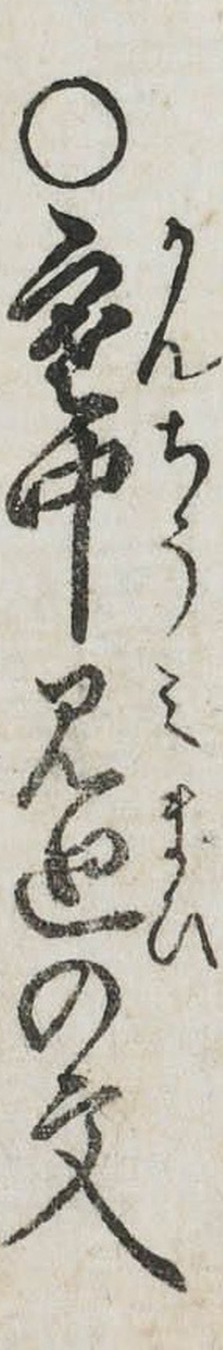○寒中見廻の文
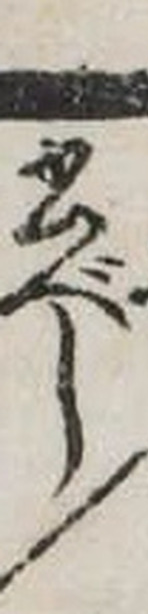書べし
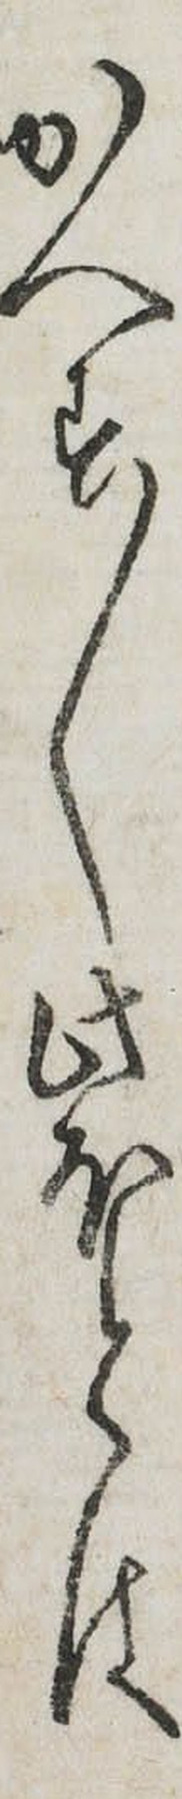かへす〳〵此ほとは
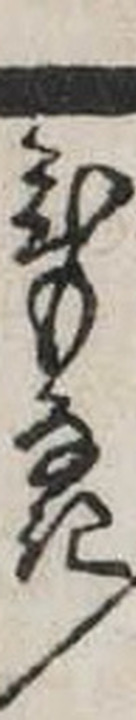ひもなき
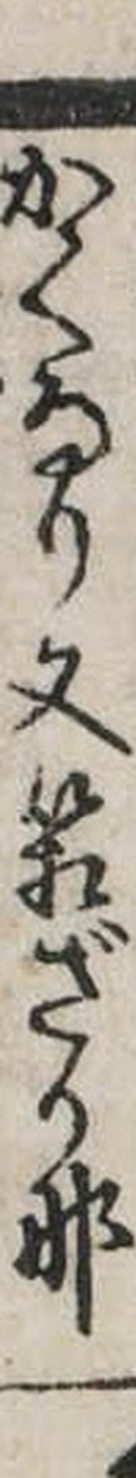かくなり又箱ざかな
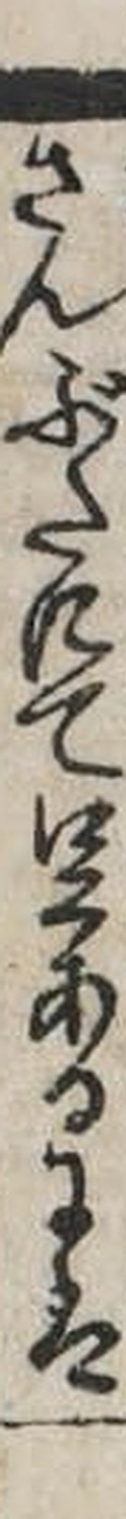さんぶたにて足あるには
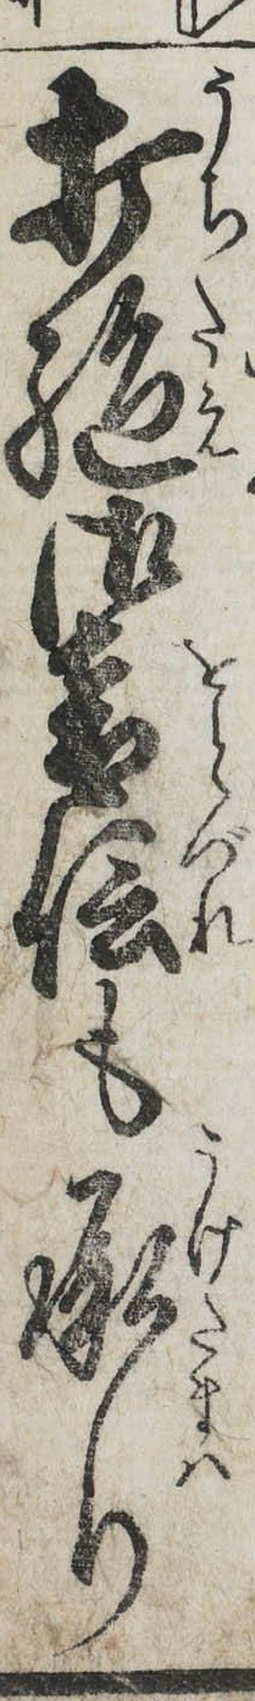打絶御音信も承り

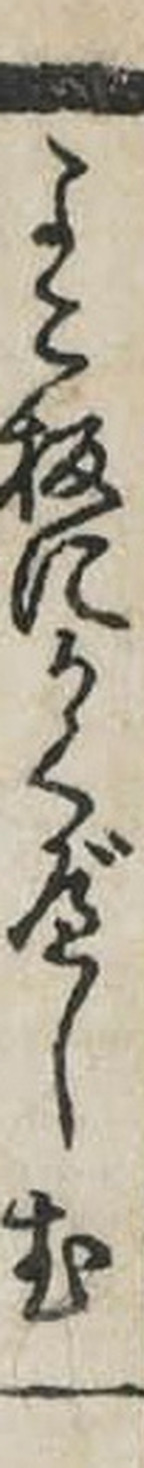よこ板にかくべし尤
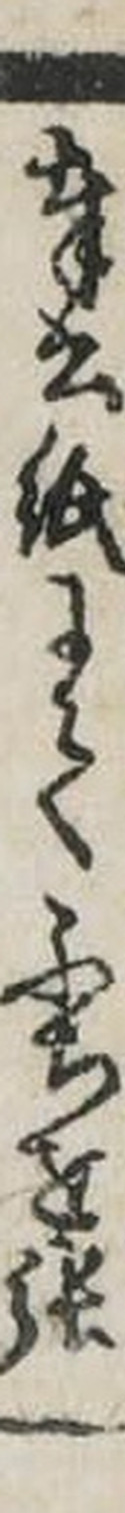奉書紙にてふちを張
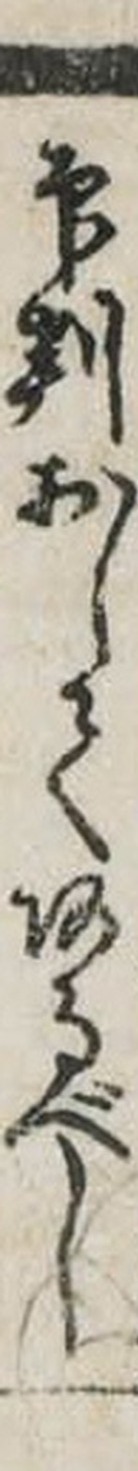印判おしてあるべし
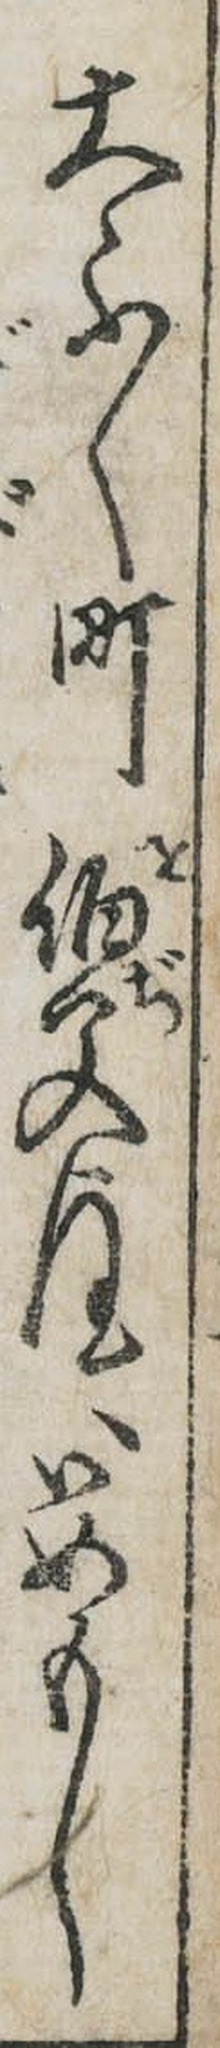大ふく町伯父さまへ御めもし
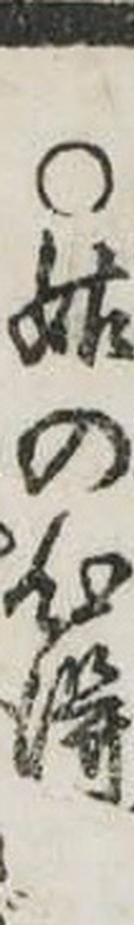○姑の心得
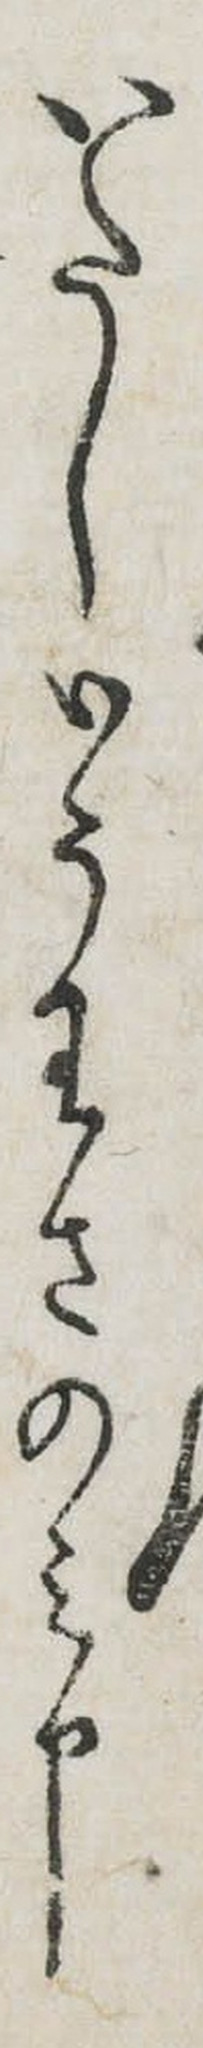いたし御うわさのみ申
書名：頭書萬用婦人手紙之文言
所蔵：東京学芸大学教育コンテンツアーカイブ
